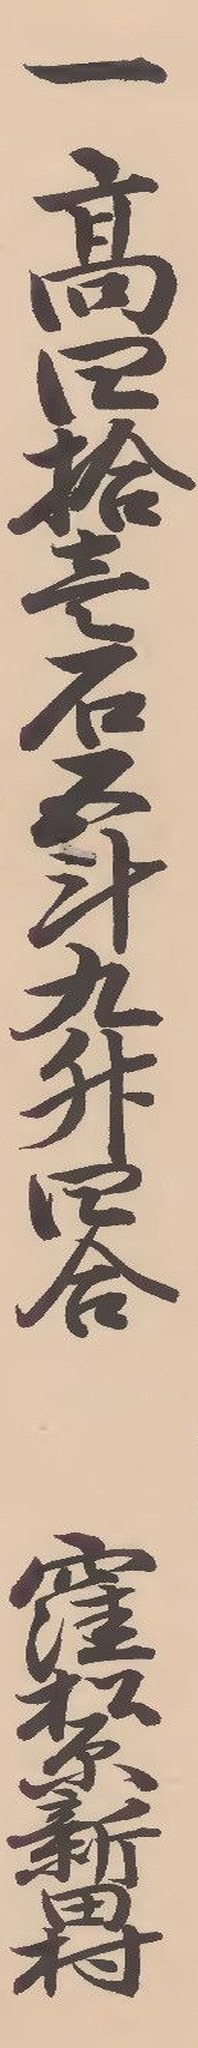一高四拾壱石五斗九升四合窪松原新田村
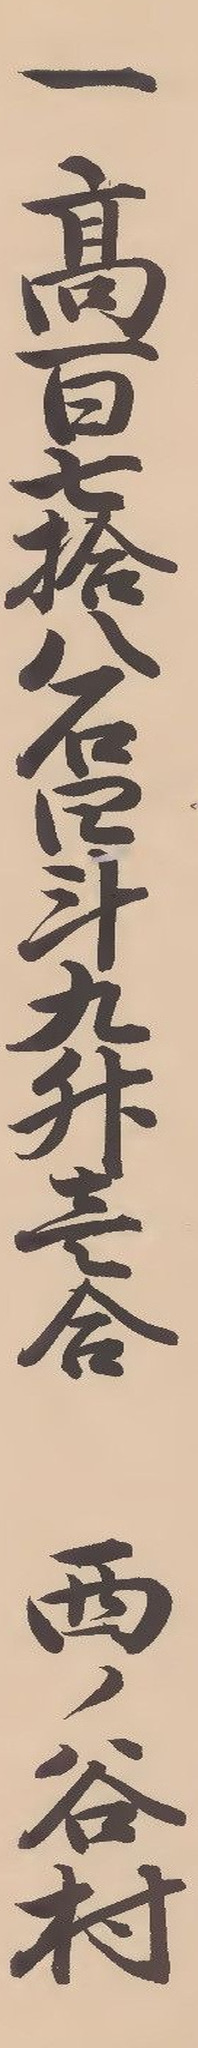一高百七拾八石四斗九升壱合西ノ谷村
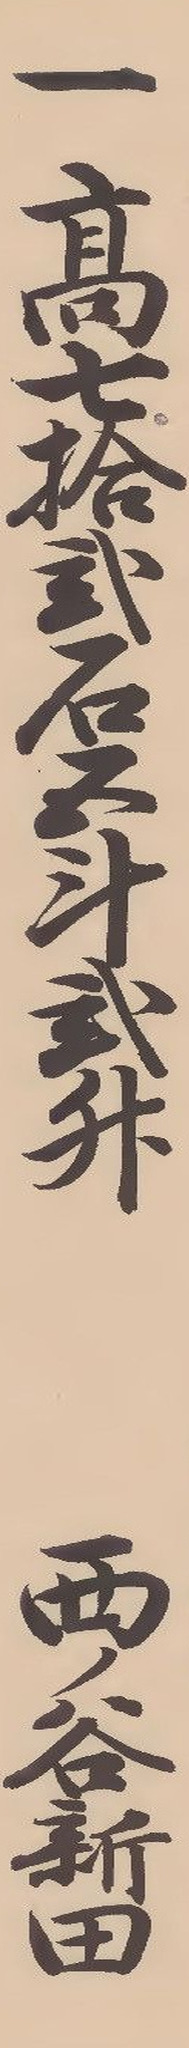一高七拾弐石五斗弐升西ノ谷新田
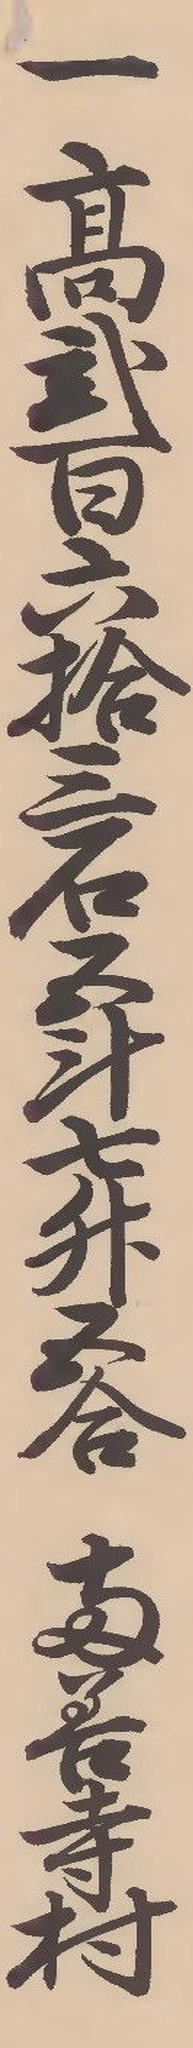一高弐百六拾三石五斗七升五合両善寺村
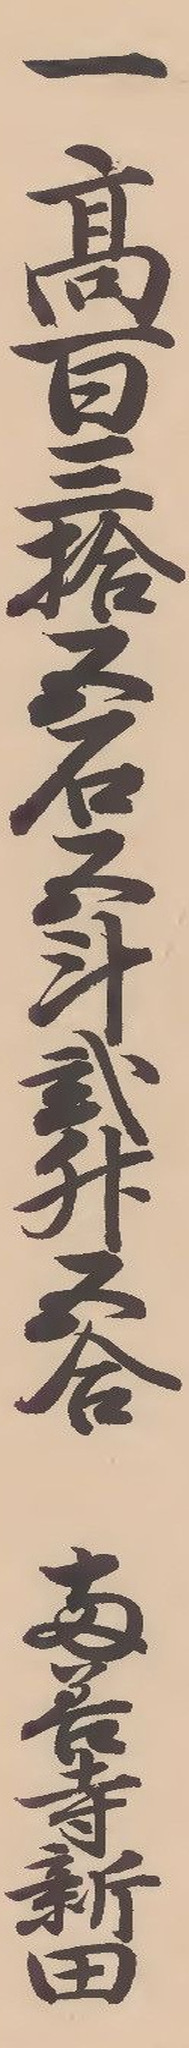一高百三拾五石五斗弐升五合両善寺新田

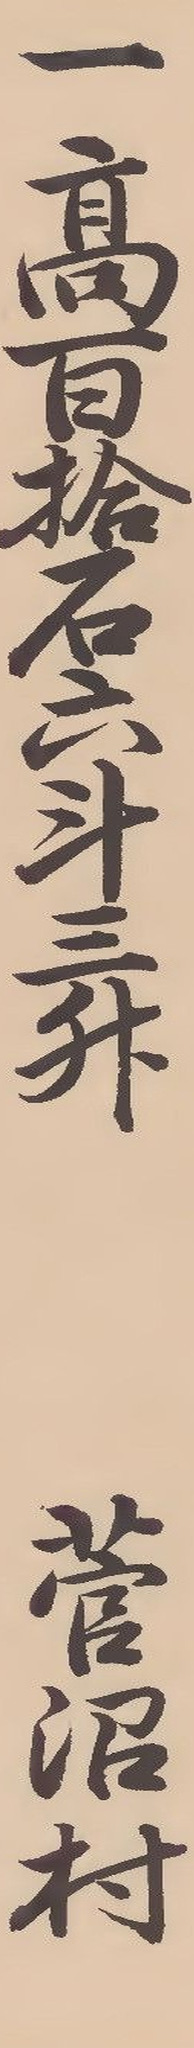一高百拾石六斗三升菅沼村
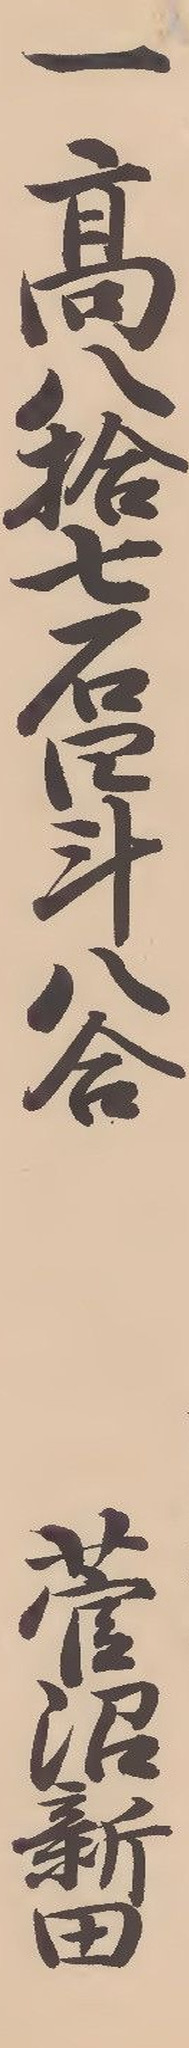一高八拾七石四斗八合菅沼新田
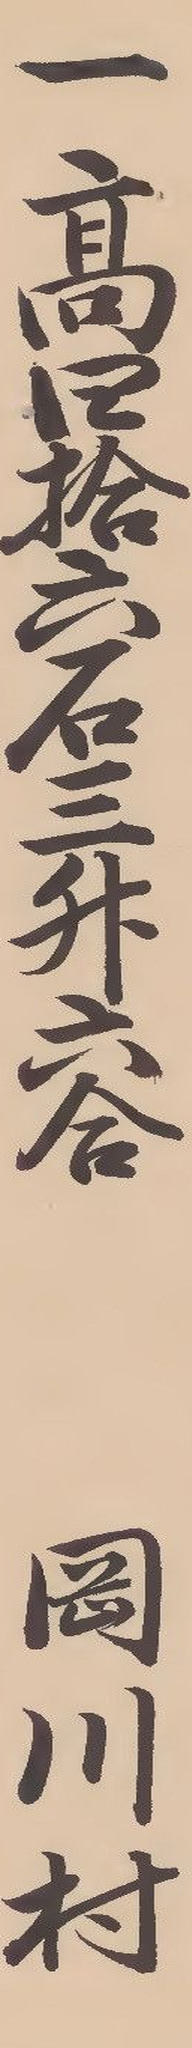一高四拾六石三升六合岡川村
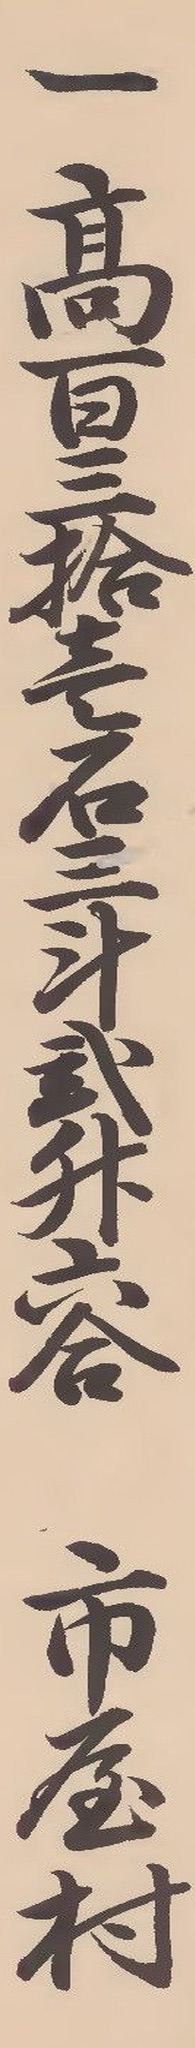一高百三拾壱石三斗弐升六合市屋村
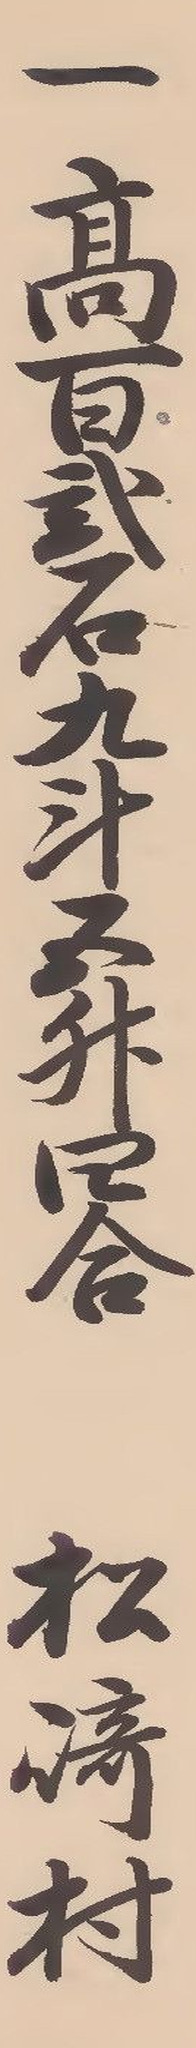一高百弐石九斗五升四合松崎村
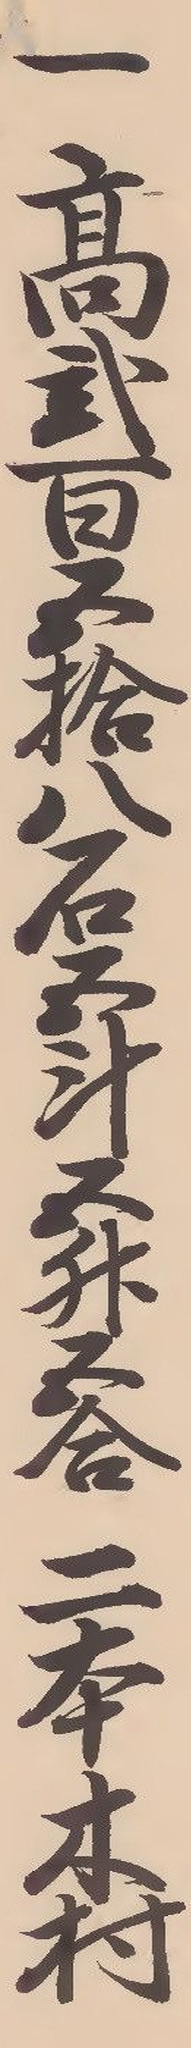一高弐百五拾八石五斗五升五合二本木村
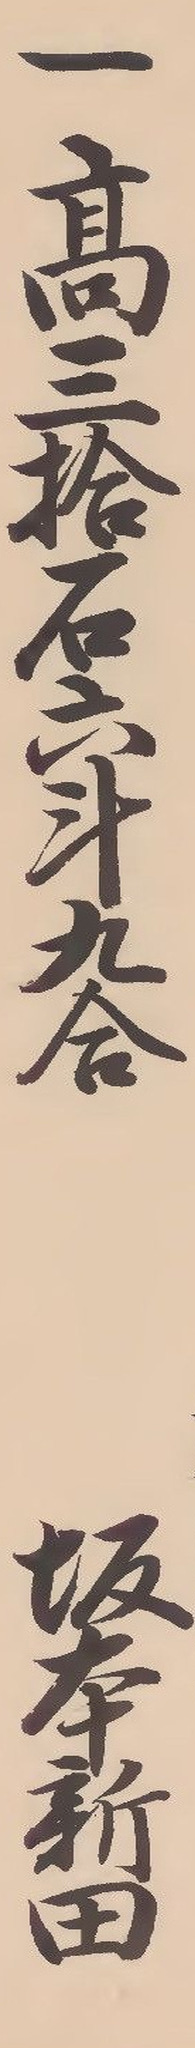一高三拾石六斗九合坂本新田

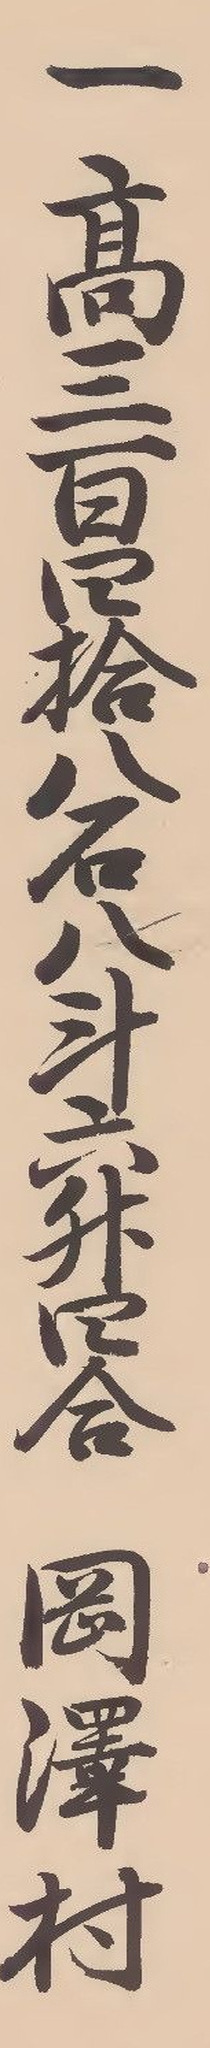一高三百四拾八石八斗六升四合岡沢村
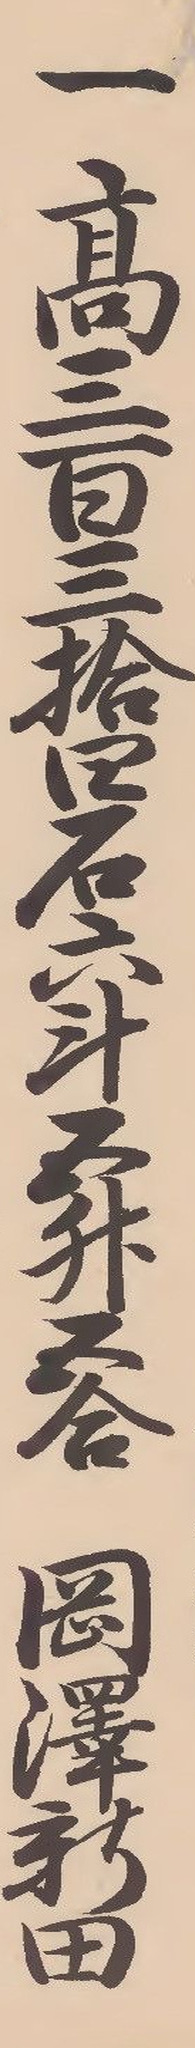一高三百三拾四石六斗五升五合岡沢新田
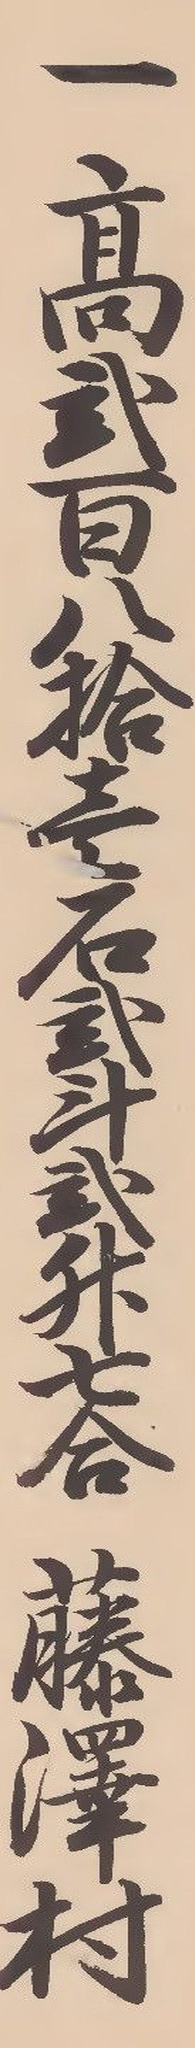一高弐百八拾壱石弐斗弐升七合藤沢村
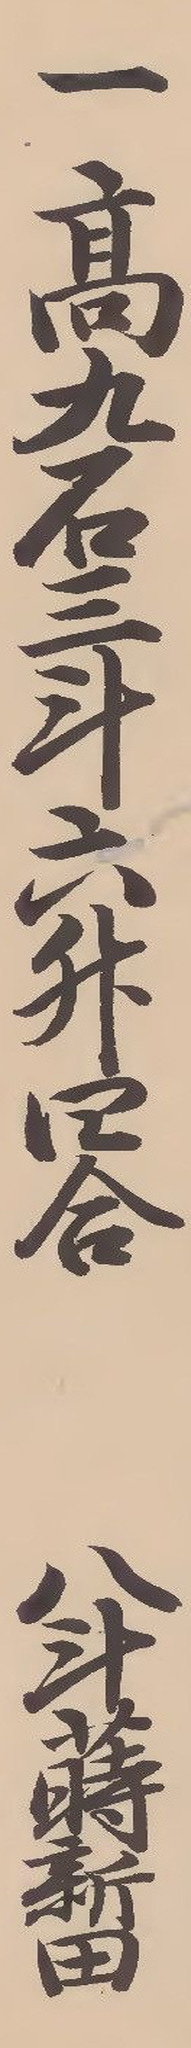一高九石三斗六升四合八斗蒔新田
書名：越後国郷帳　上
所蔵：国立公文書館 National Archives of Japan
